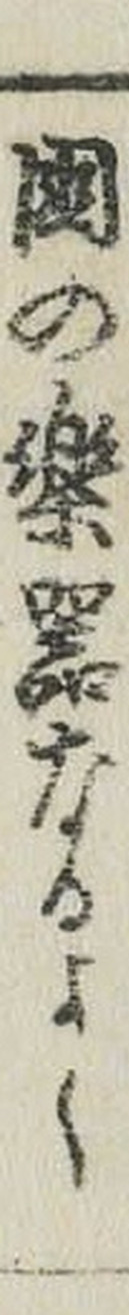国の楽器なるよし
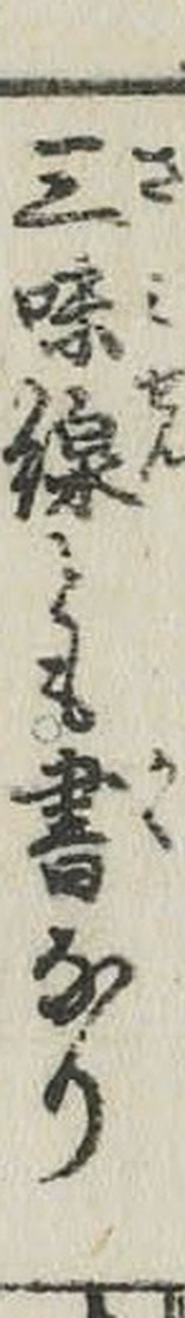三味線とも書なり
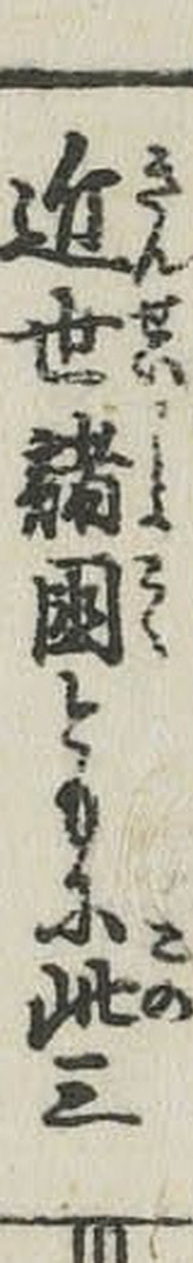近世諸国ともに此三
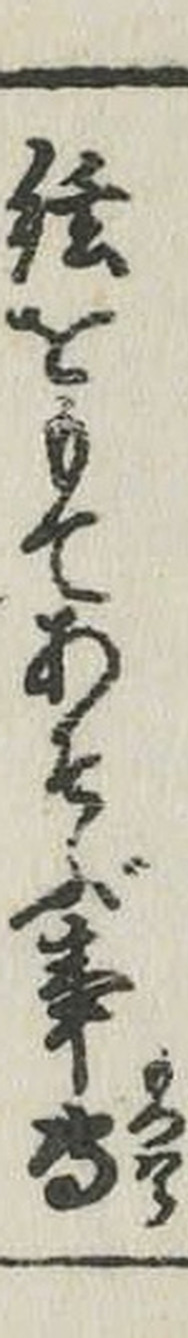絃をもてあそぶ事専
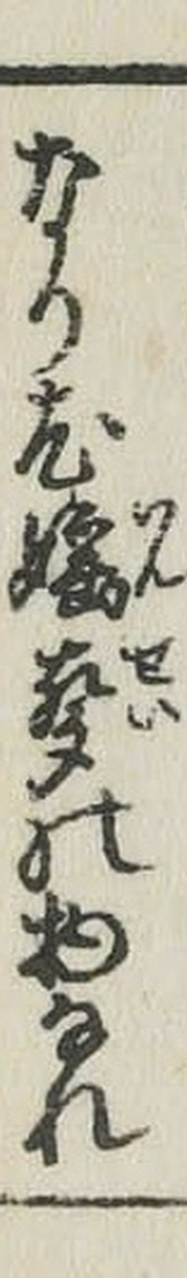なり尤婬声の物なれ
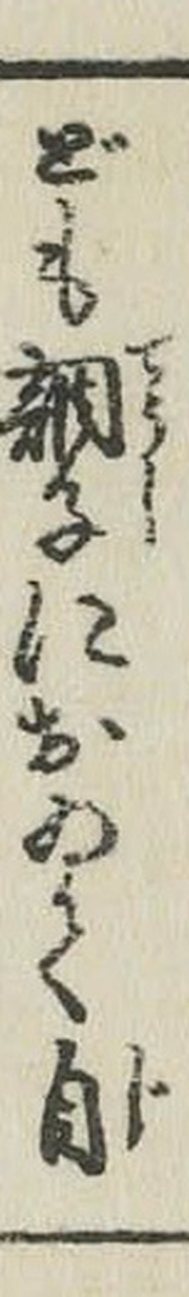ども調子におゐて自
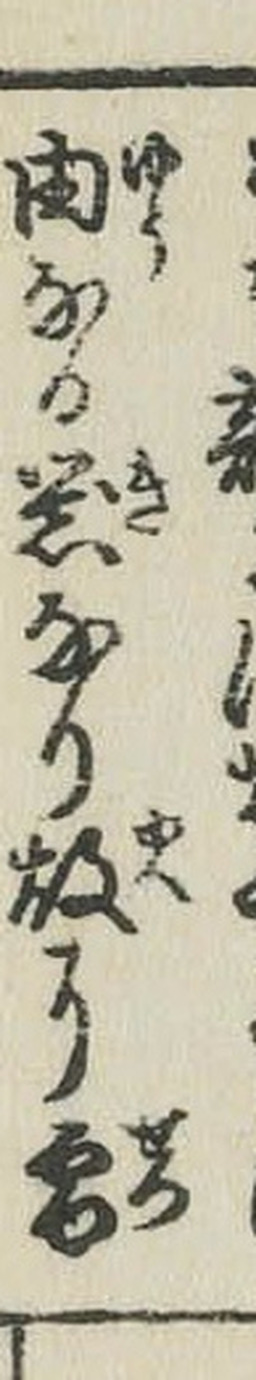由なる器なり故に雪
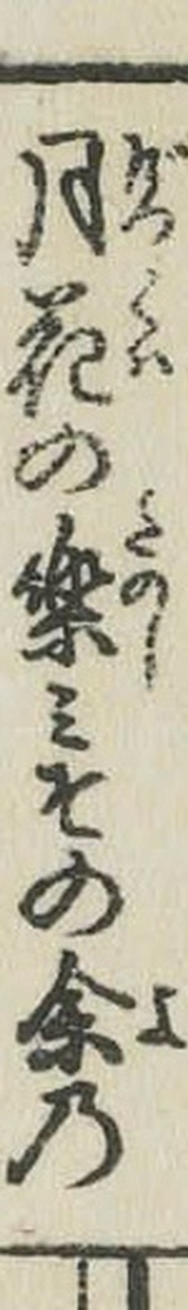月花の楽みその余の
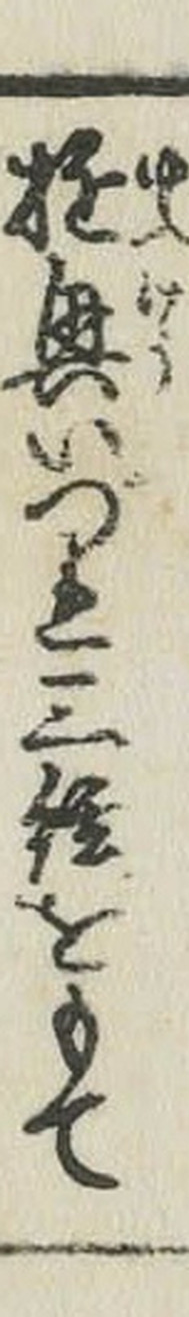遊興いづれ三絃をもて
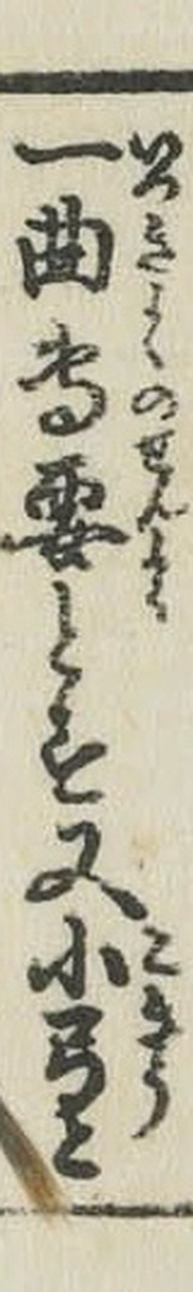一曲専要とす又小弓と
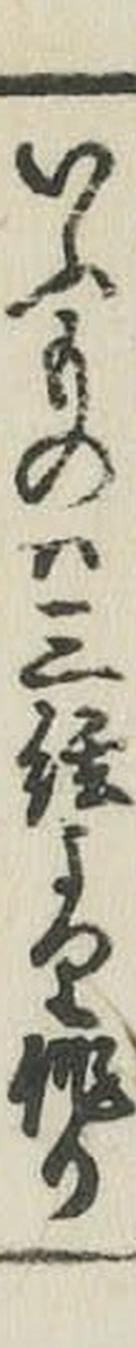いふものは三絃より作り
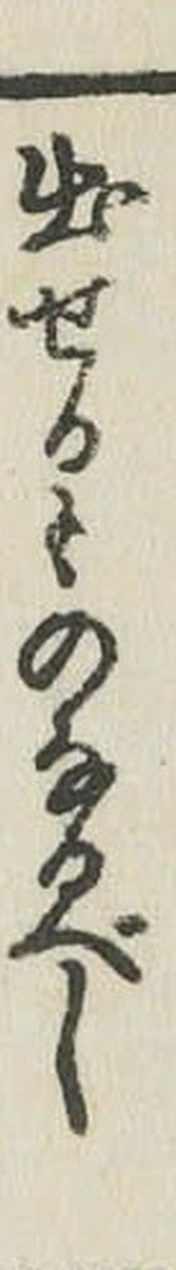出せるものなるべし
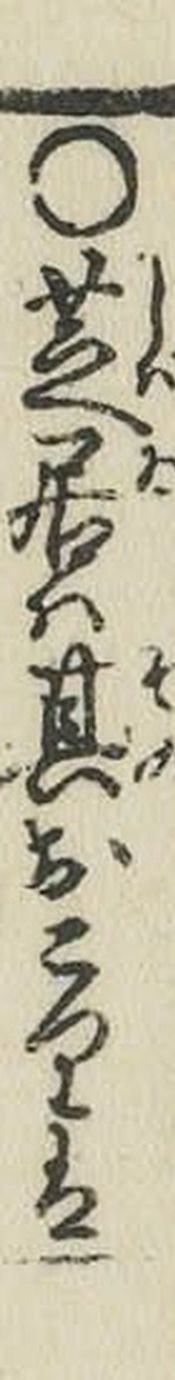○芝居は其おこりは
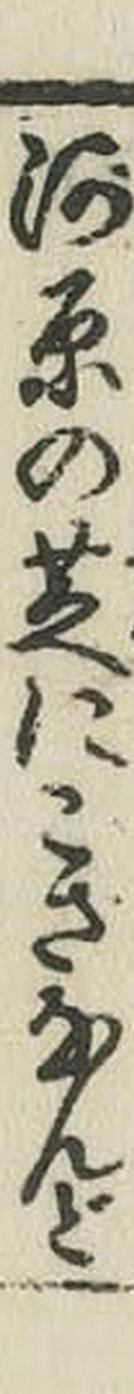河原の芝にこさなんど
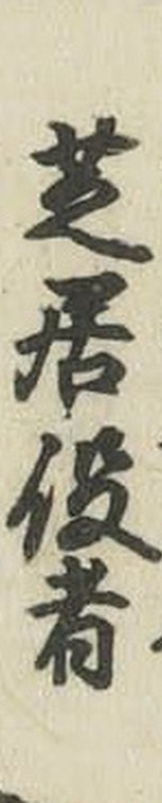芝居役者
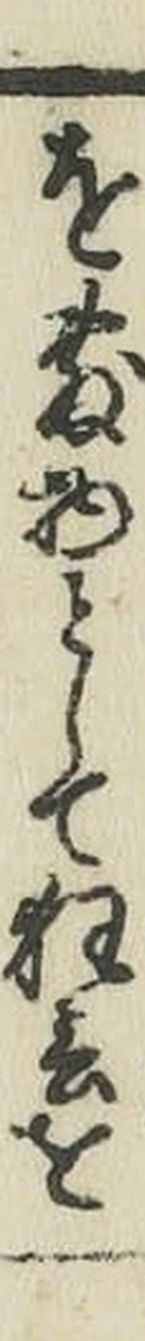を敷物として狂言を
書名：増補頭書訓蒙図彙大成 10巻 10:巻之21
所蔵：東京学芸大学教育コンテンツアーカイブ
